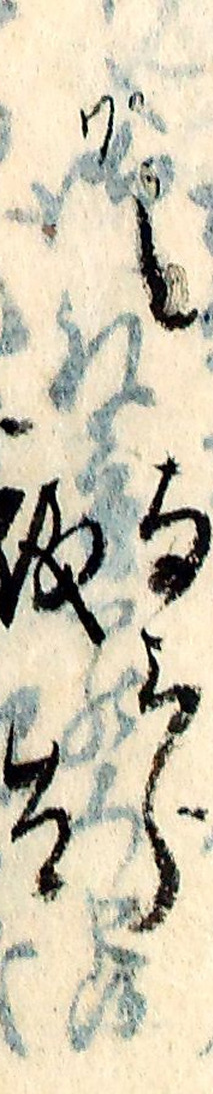与三郎
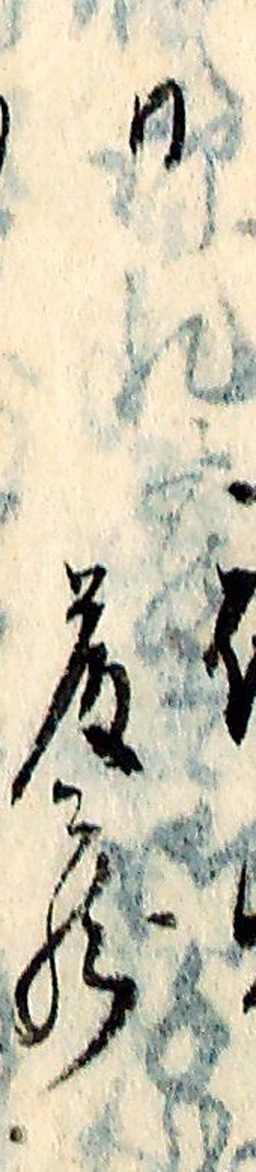同藤蔵
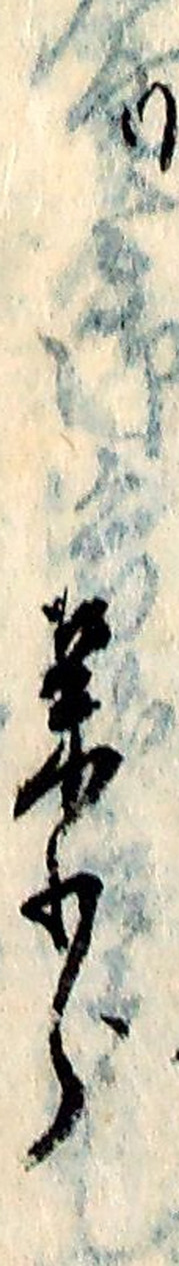同栄五郎
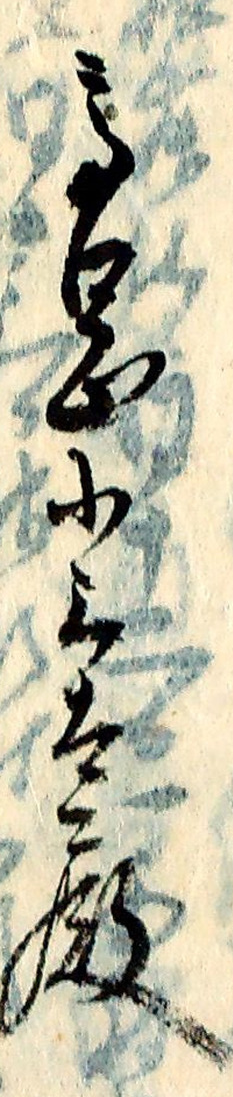高岡小三太殿
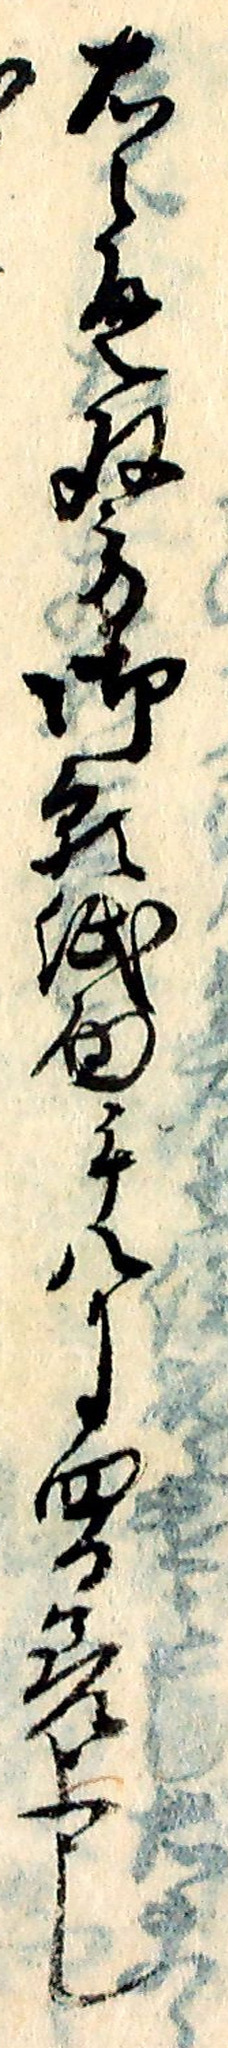右之通双方御願紙面午八月四日差上申候
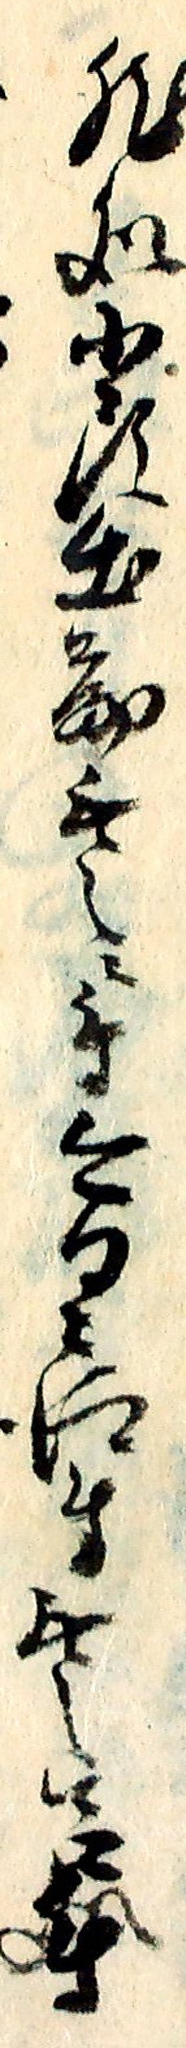然処小頭出勤無之に付今日被仰付無之候に付
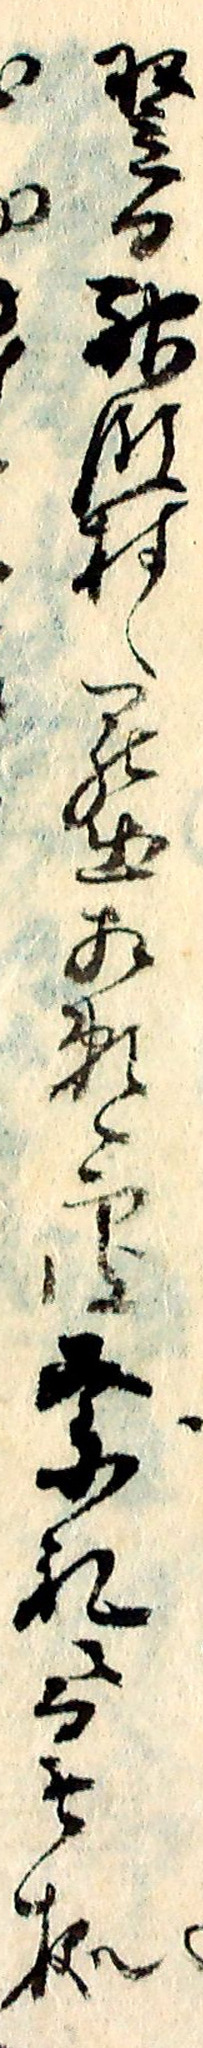翌日神領村へ罷出相願候処祭礼にて無拠
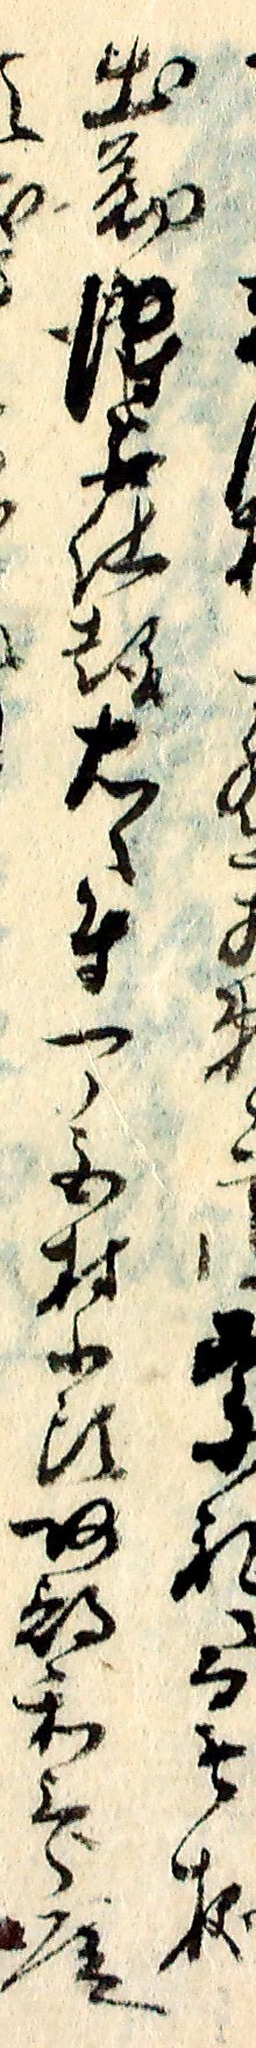出勤得不仕趣右に付一ノ宮村小頭阿部和三郎殿
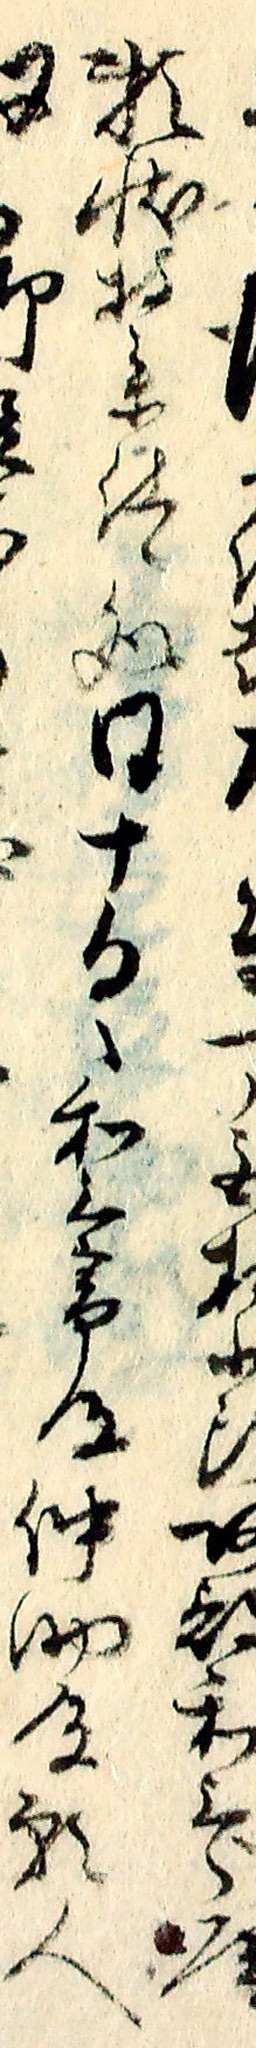頼状持参仕候処同十日へ和三郎殿仲助殿願人
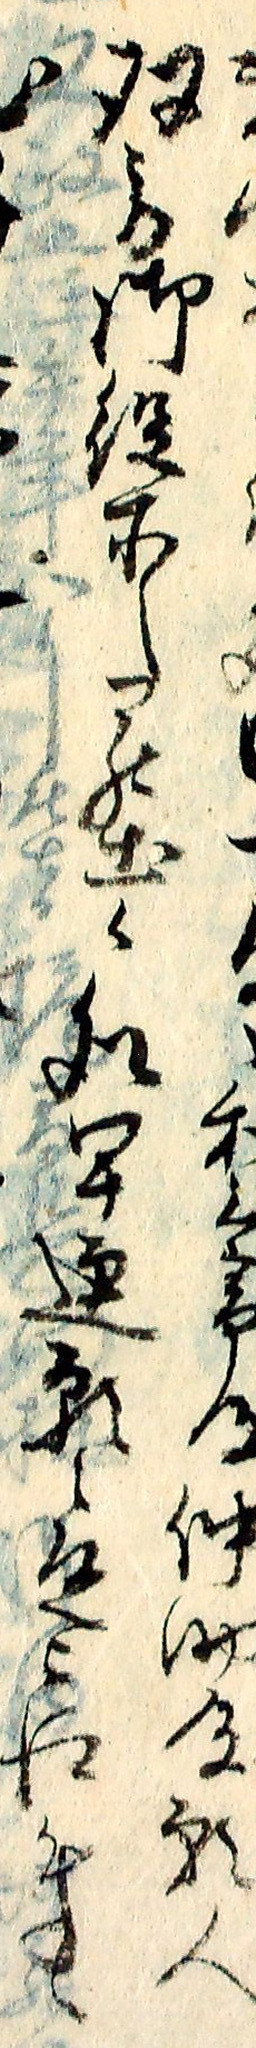双方御役所へ罷出候処早速願之通被仰付候
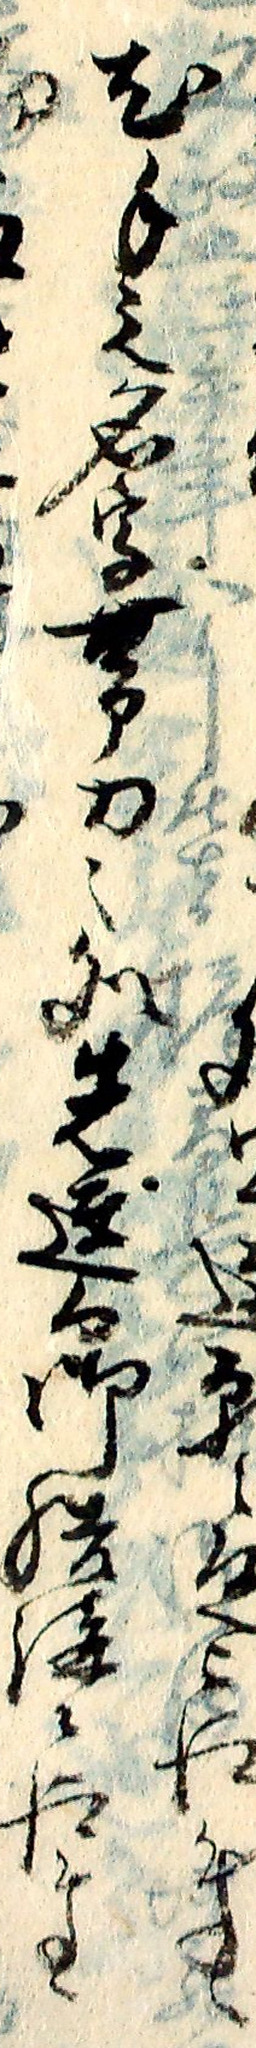尤手元名字帯刀之処先達て御結構被仰付候
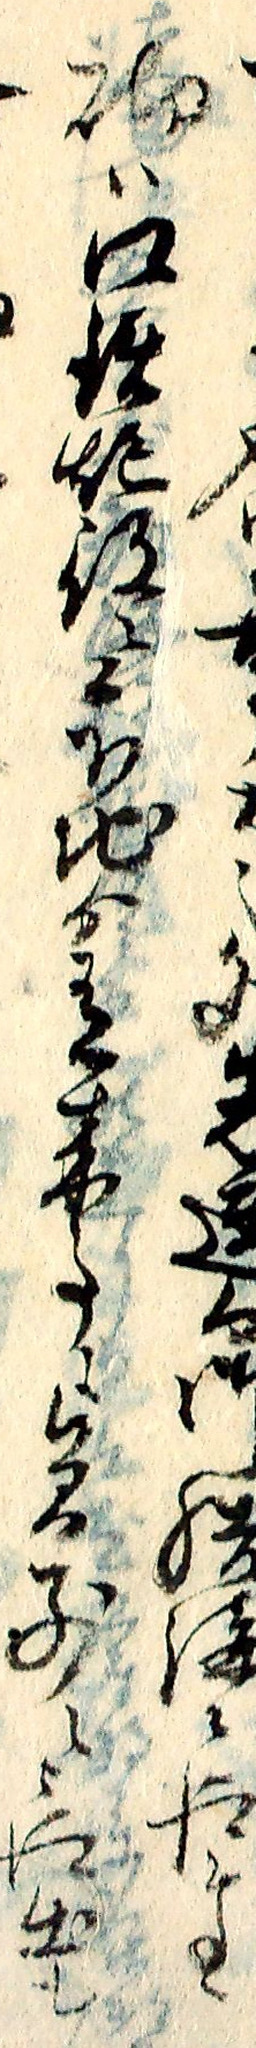砌は郷鉄炮にて下地ゟ有来事に候間別に被仰出も
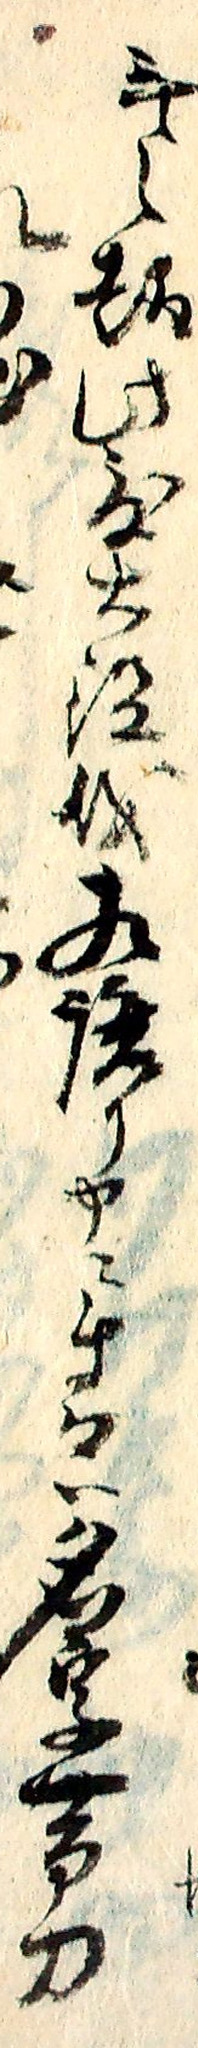無之趣此度右役を相譲り申に付ては名字帯刀
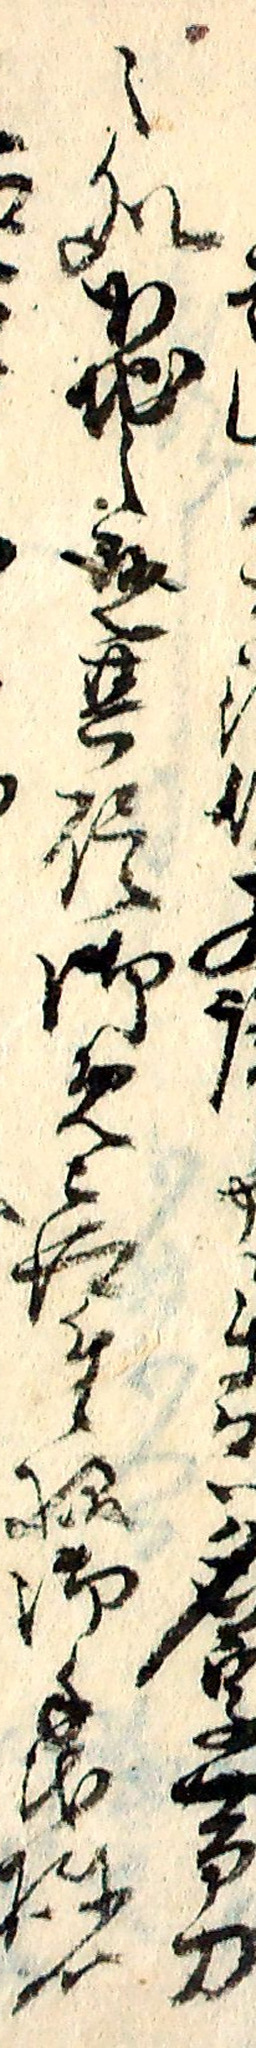之処下地之通其儘御免被仰付候様御手代様ゟ
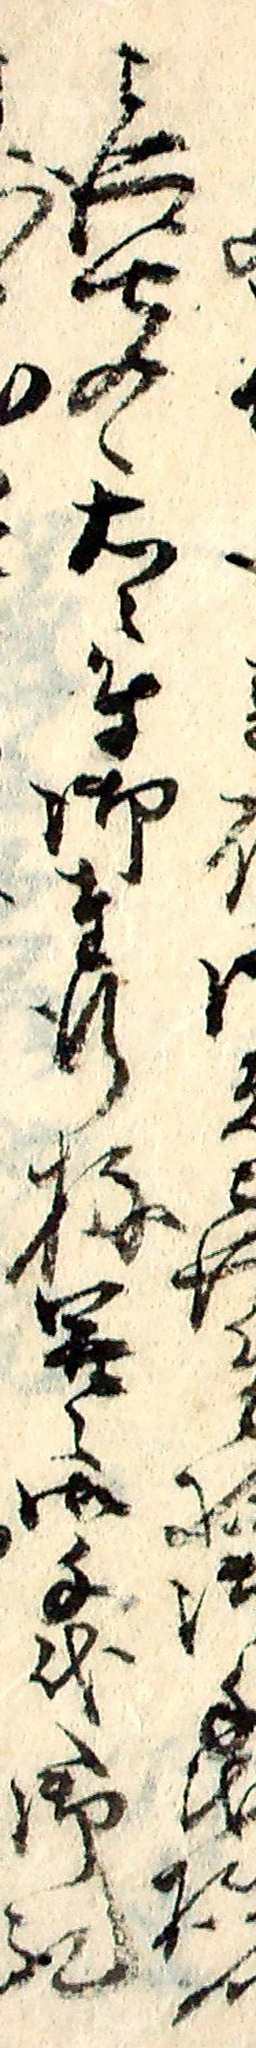被仰聞候右に付御奉行様並に御手代へ御礼
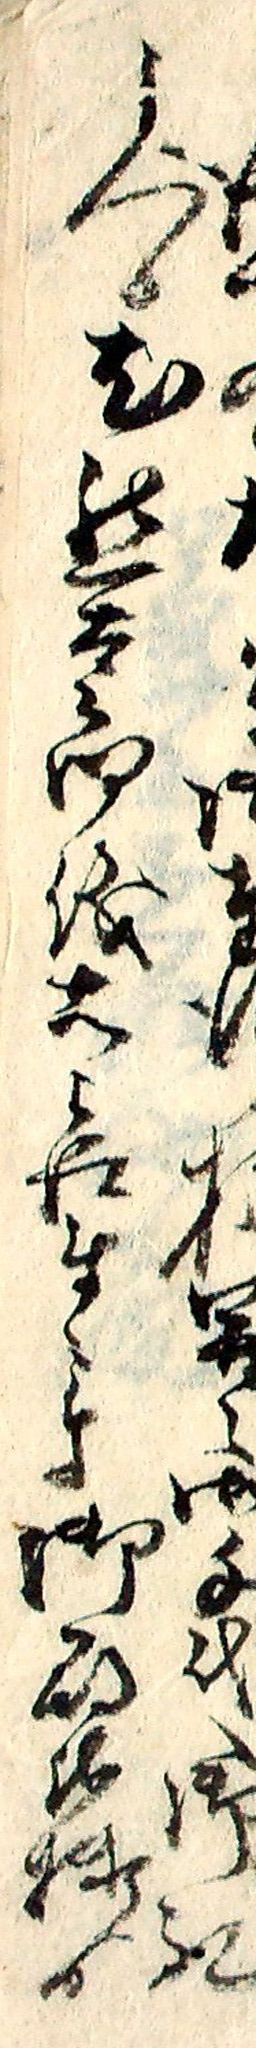申上る尤熊太郎儀右被仰付に付御郡代様ゟ
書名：諸御願書控(後藤氏壱番）
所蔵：鳴門教育大学 Naruto University of Education
